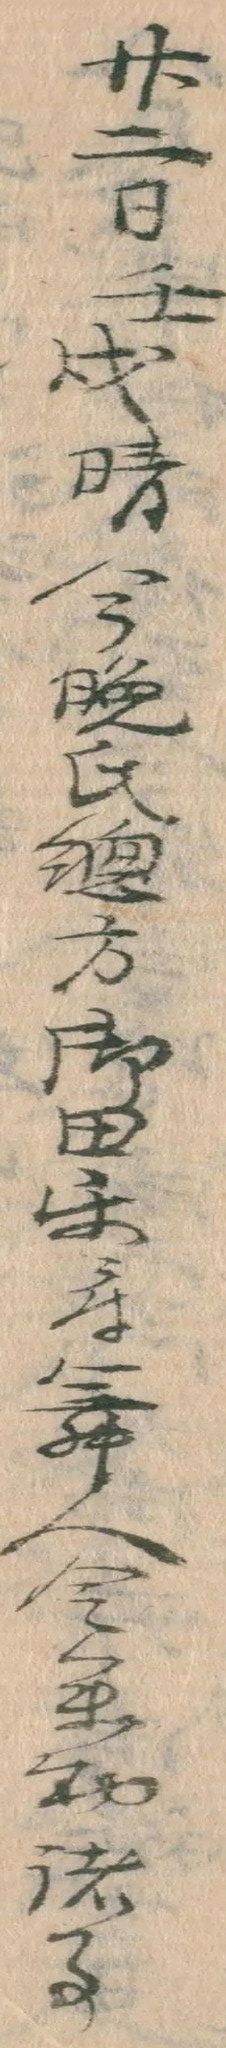廿二日壬戌晴今晩氏總方御田楽ニ付舞人令参勤諸事
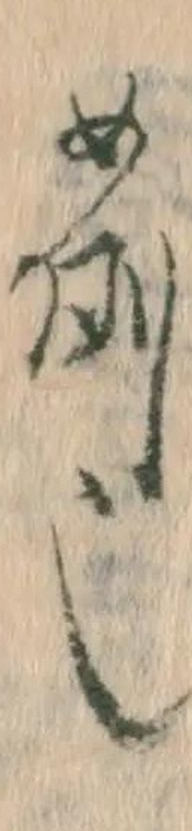如例也
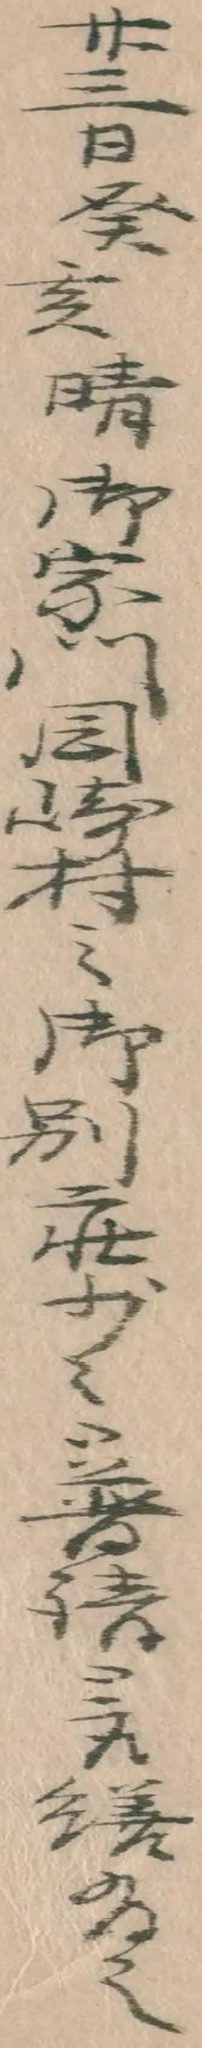廿三日癸亥晴御家門丹後村之御別荘少〻御普請御取繕有之
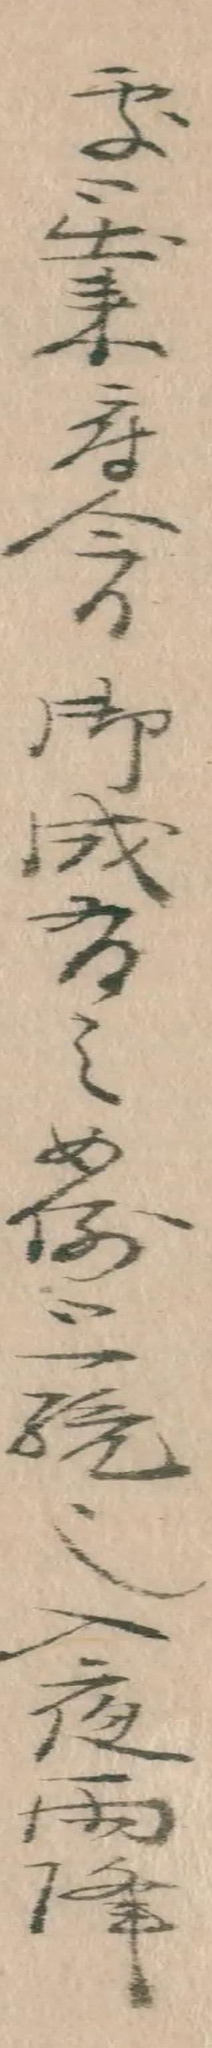處御出来ニ付今日御成有之如例御一統也今夜雨降
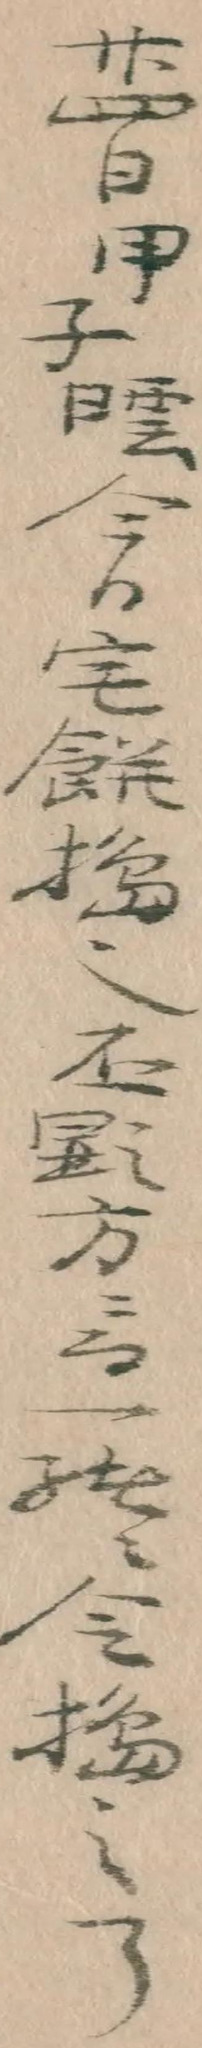廿四日甲子曇今日宅餅搗也丕顕方ニ而一緒ニ令搗之了
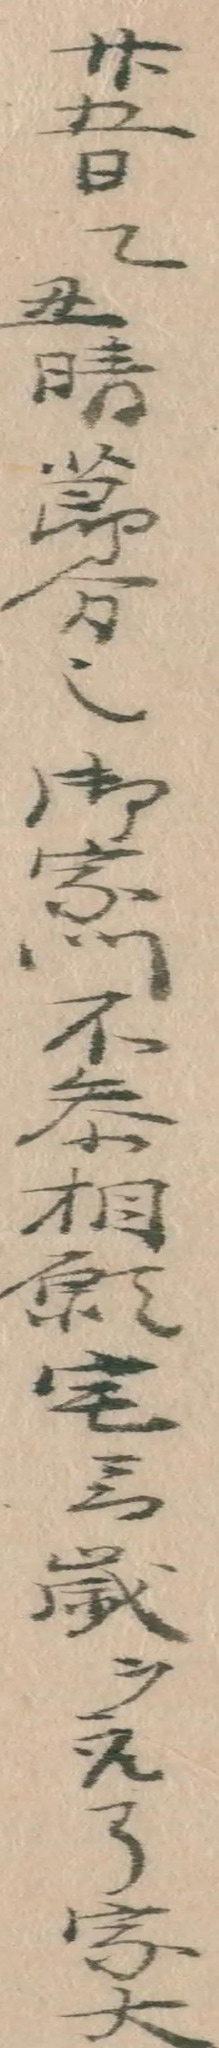廿五日乙丑晴節分也御家門不参相願宅ニ而歳ヲ取了家大
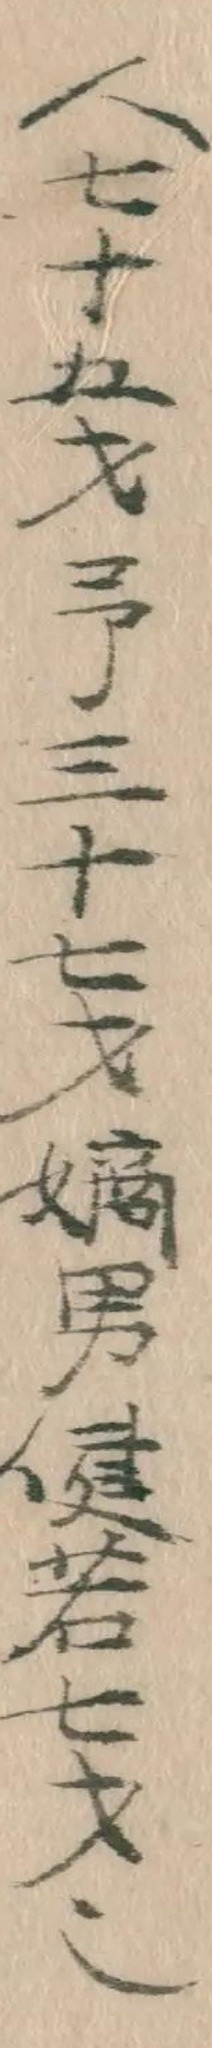人七十五才予三十七才嫡男健若七才也
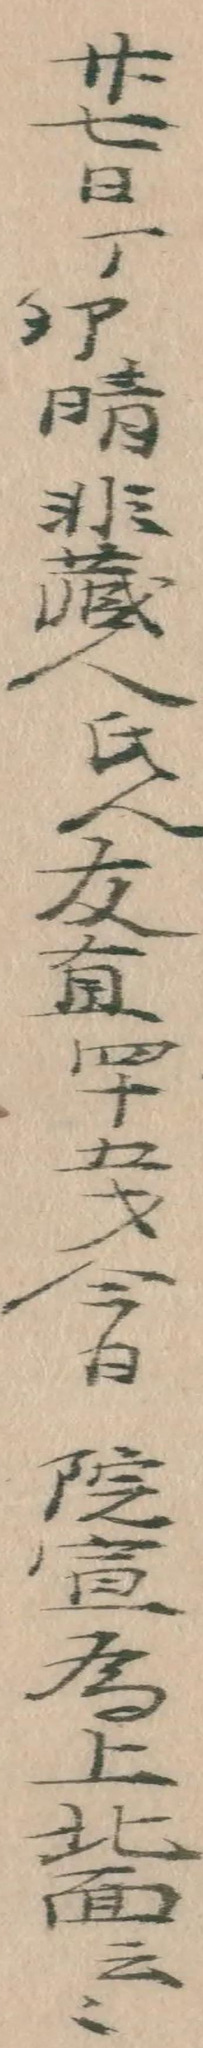廿七日丁申晴非蔵人氏人友直四十五才今日院宣為上北面云〻
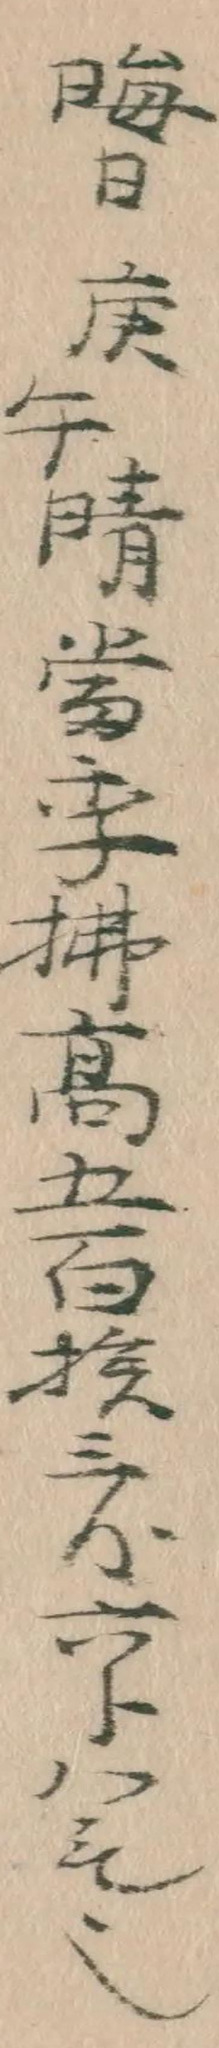晦日庚午晴當季払高五百拾三匁六分八毛也
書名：賀茂社記録. 第63冊
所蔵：国立国会図書館 National Diet Library, JAPAN
